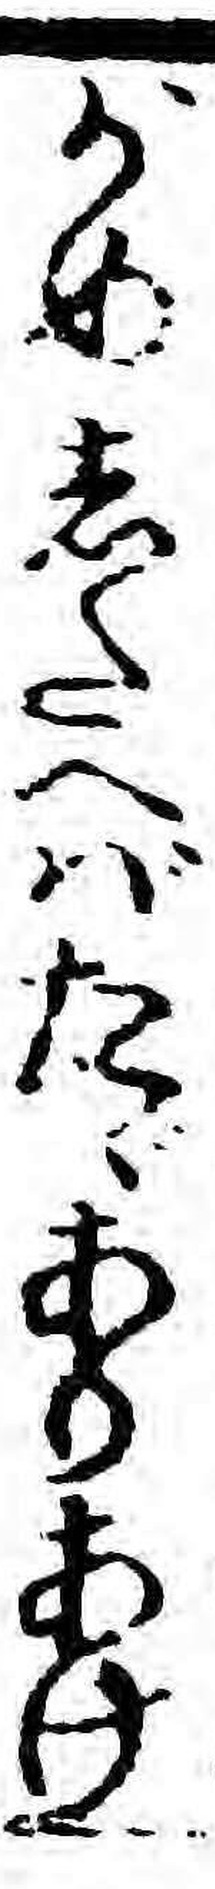がめしたへばたゞありあけ
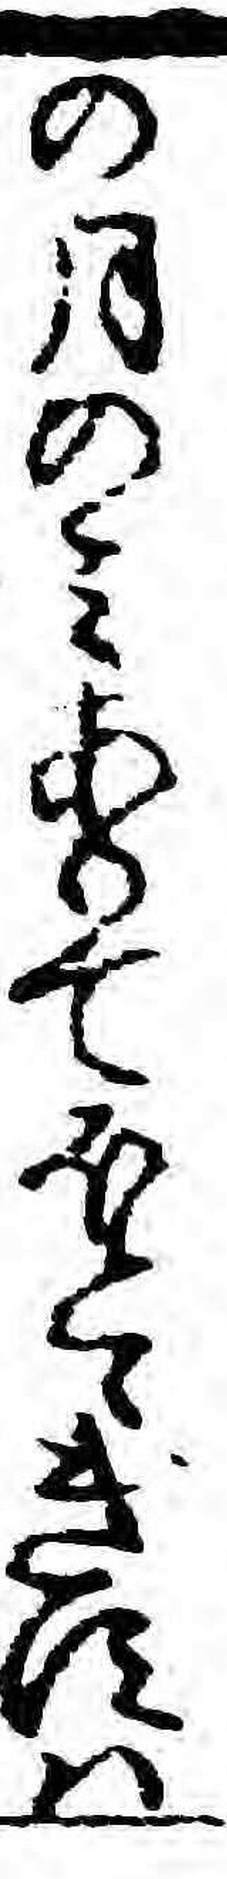の月のみありてほとゝぎすは
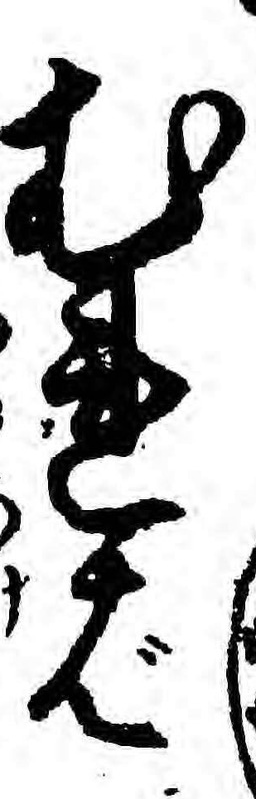むれば
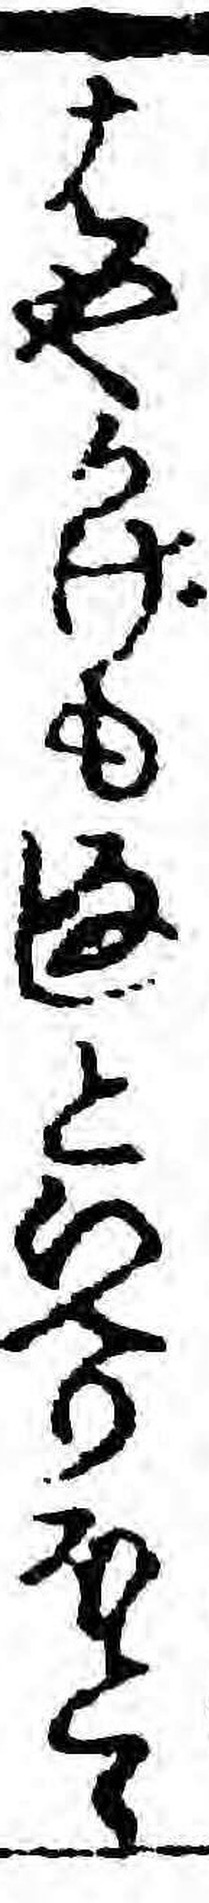はやかげもなしといへりほとゝ
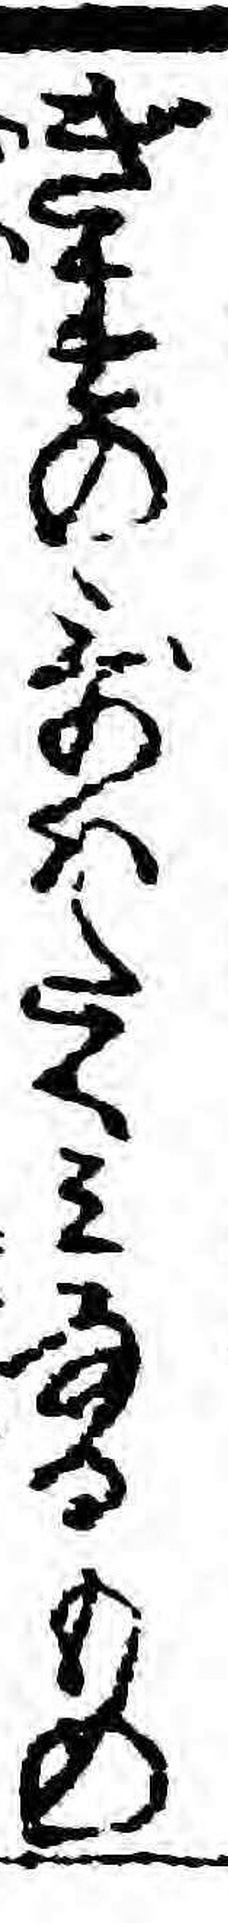ぎすの哥はたくみなるもの
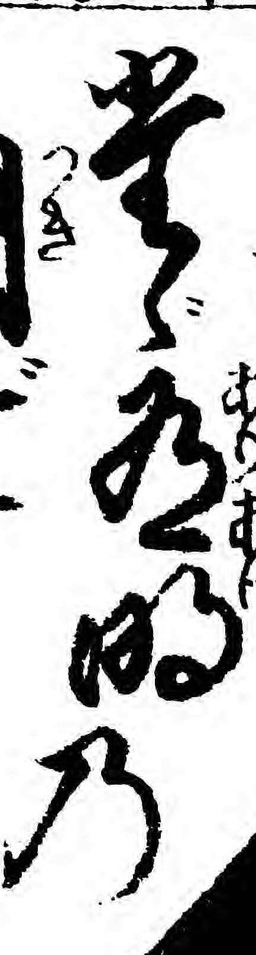たゞ有明の
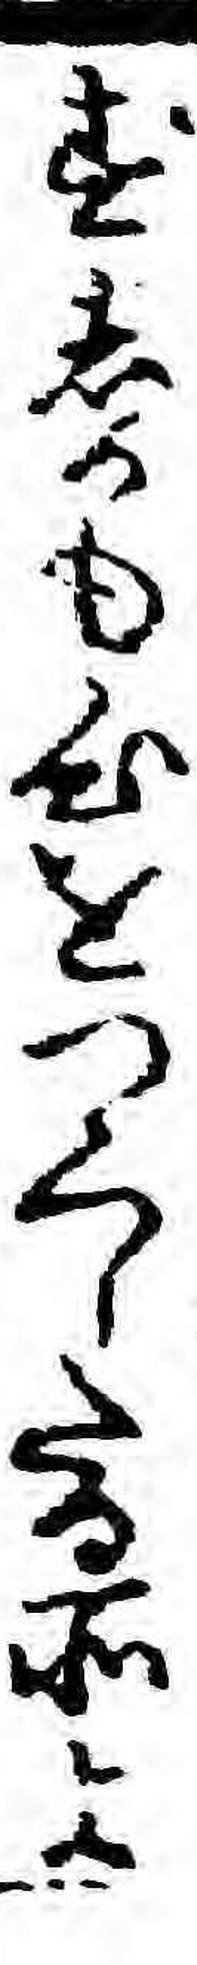ずしかも心をつくしたる所よ
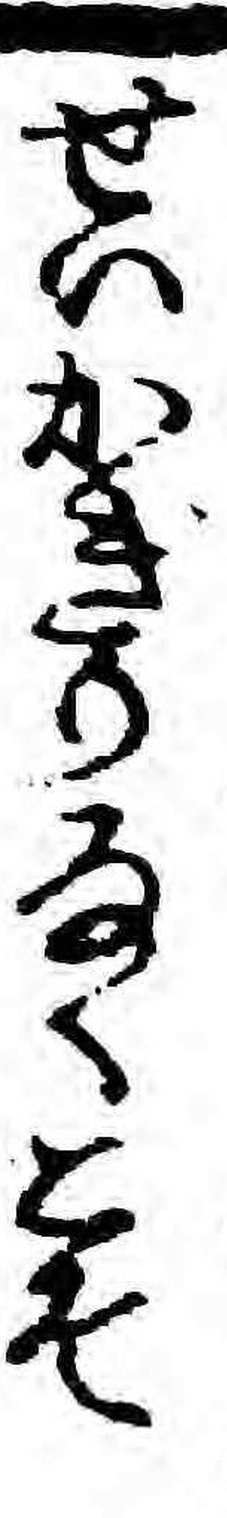せいかぎりなくこそ
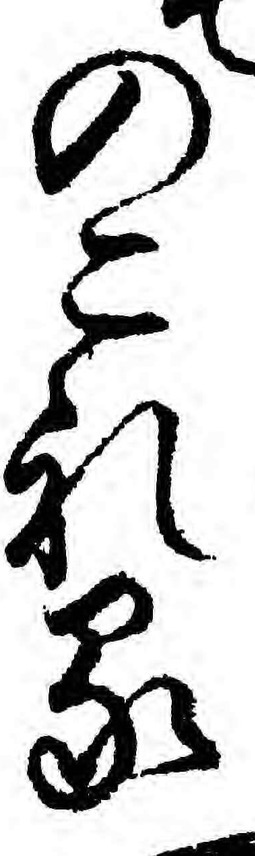のこれる

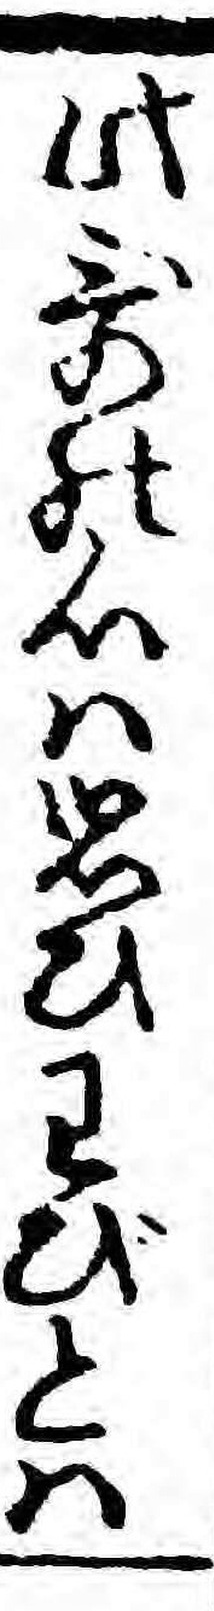此哥の心は思ひわびとは
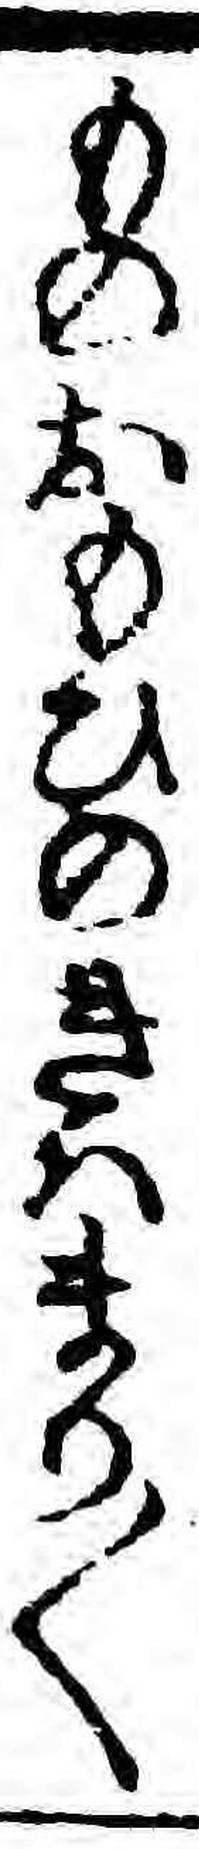もの思ひのきはまり〳〵
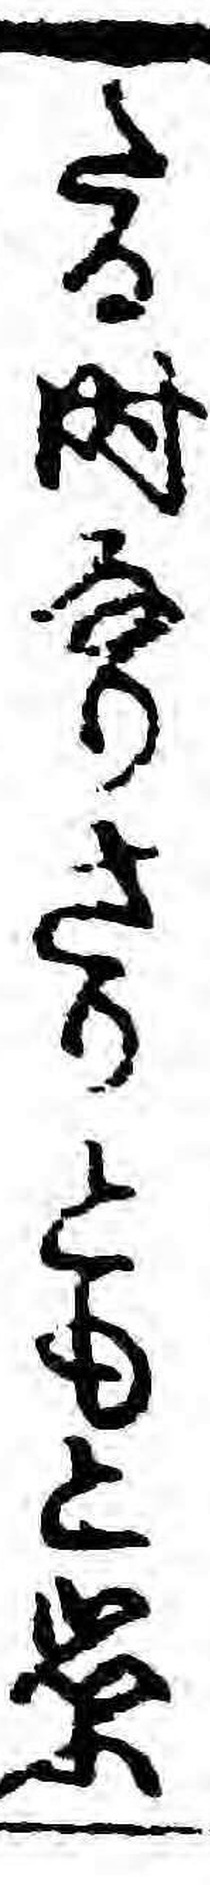たる時なりさりともと思ふ
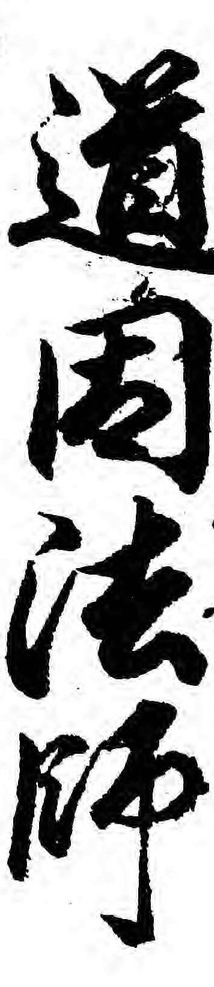道因法師
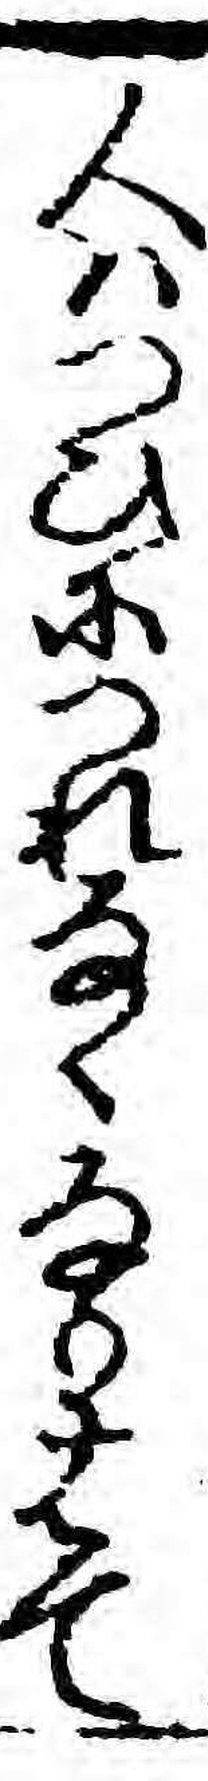人はつひにつれなくなりはて
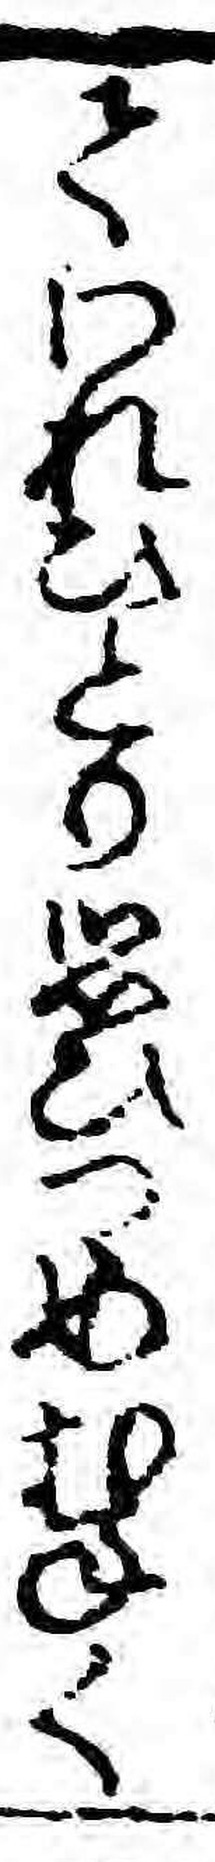てわれひとり思ひつめむねく
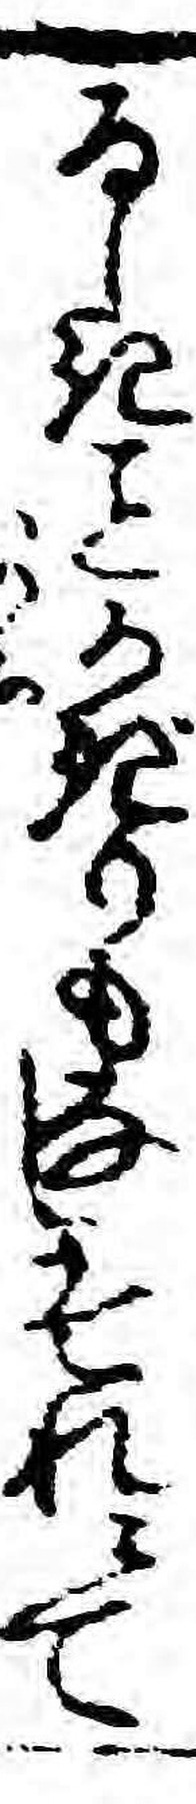るしきことかぎりもなしそれにて
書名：頭書和歌注譯／壽賀多百人一首小倉錦
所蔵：国文学研究資料館
